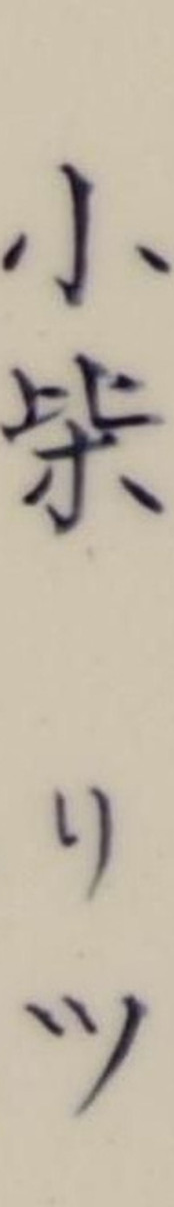小柴リツ

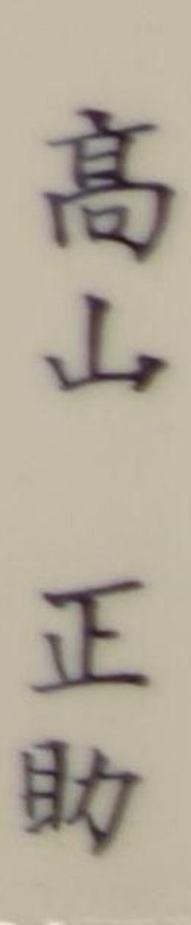高山正助
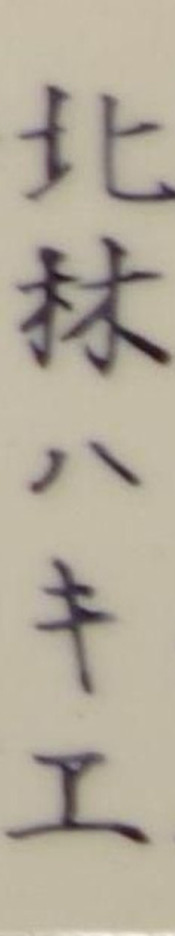北林ハキヱ
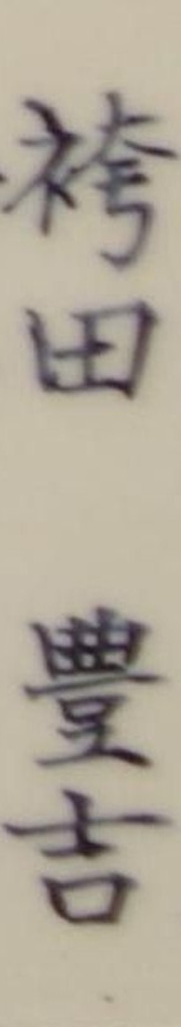袴田豊吉
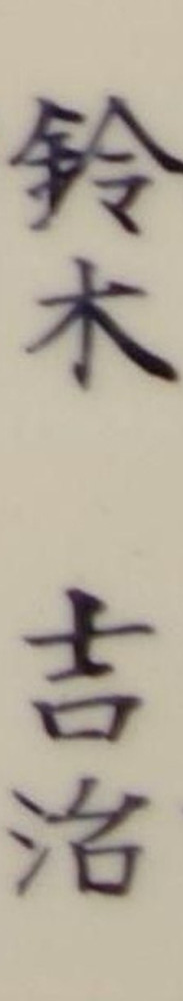鈴木吉治
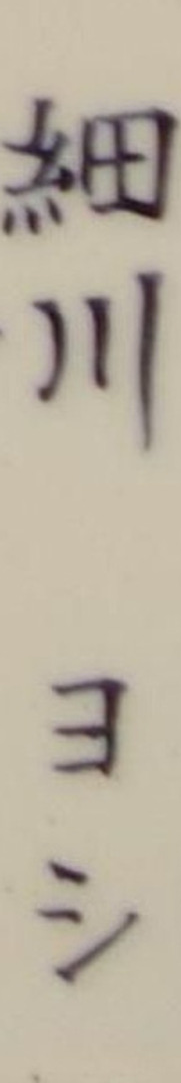細川ヨシ
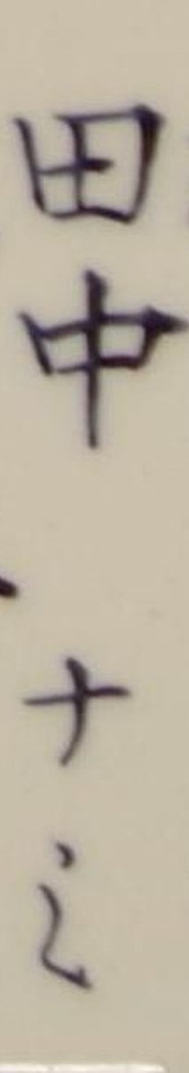田中ナミ
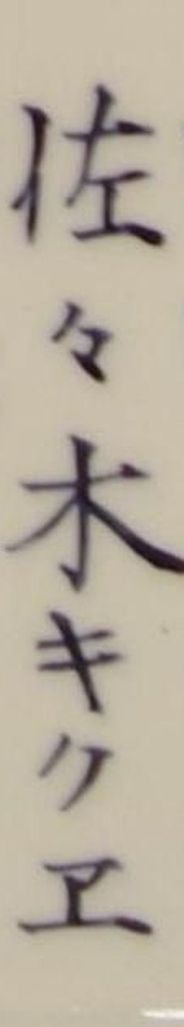佐々木キクヱ
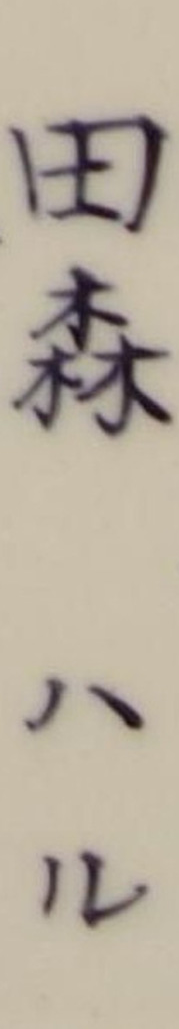田森ハル
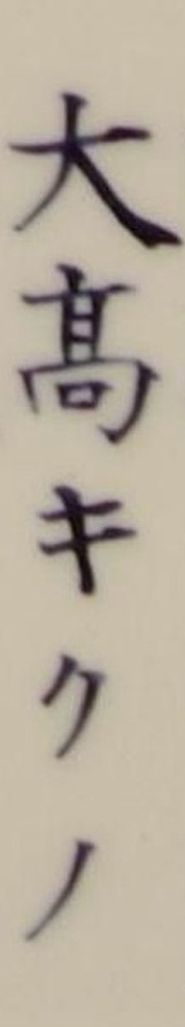大高キクノ
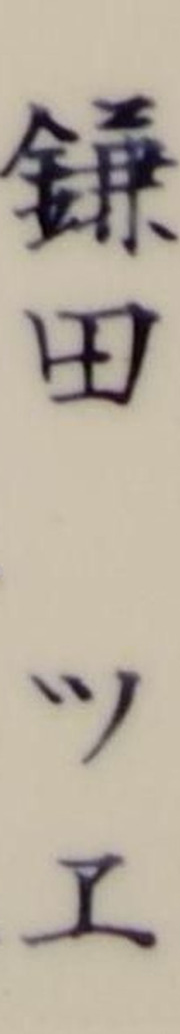鎌田ツヱ
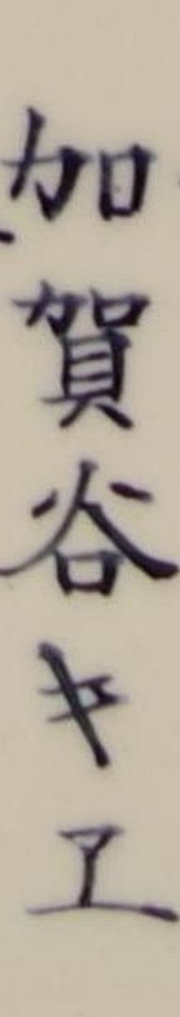加賀谷キヱ
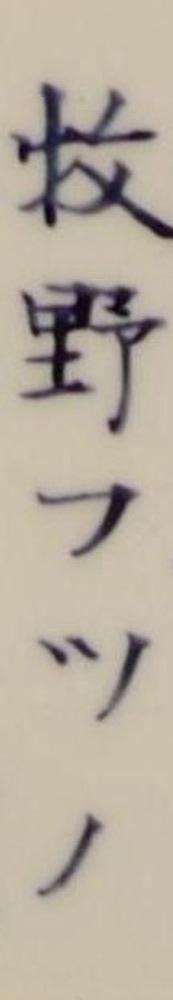牧野フツノ
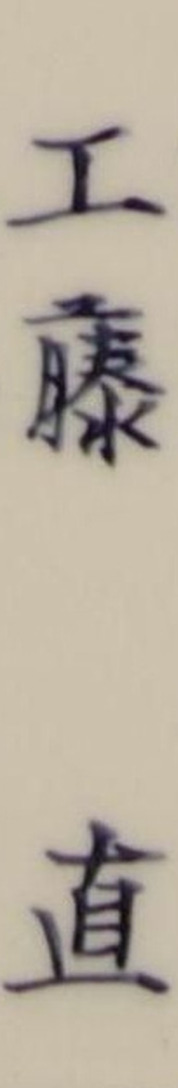工藤直
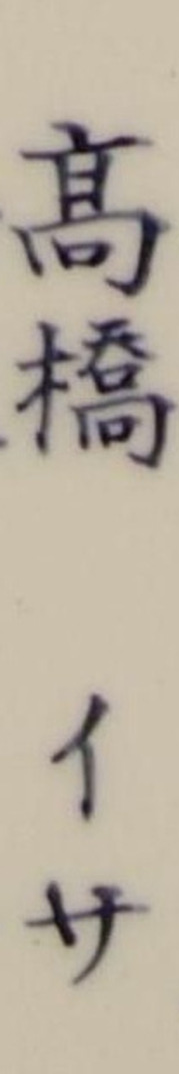高橋イサ
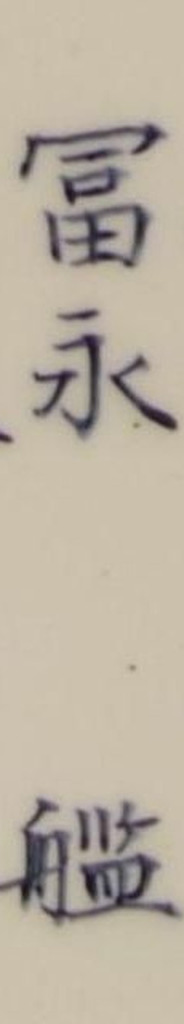冨永艦
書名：E~L
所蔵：高野山金剛峯寺
